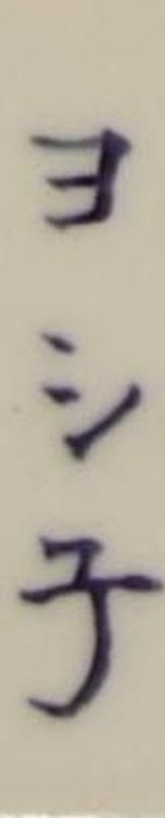ヨシ子

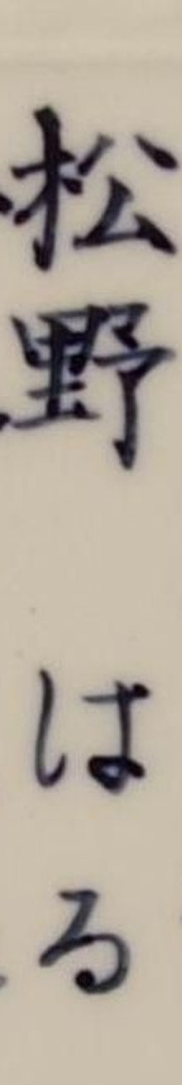松野はる
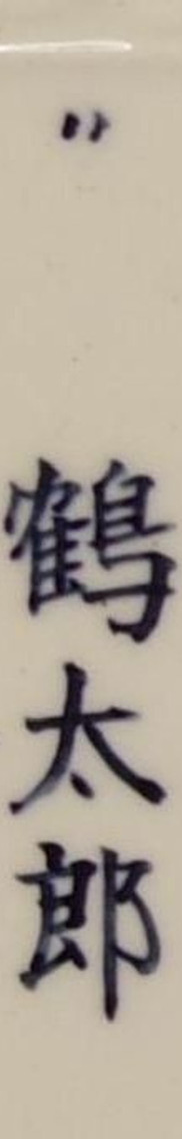鶴太郎
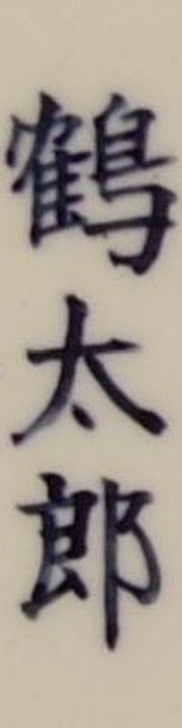鶴太郎
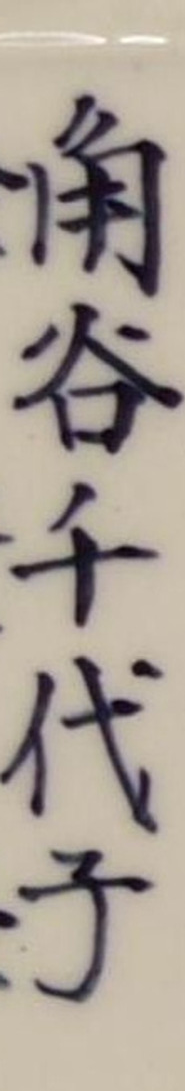角谷千代子
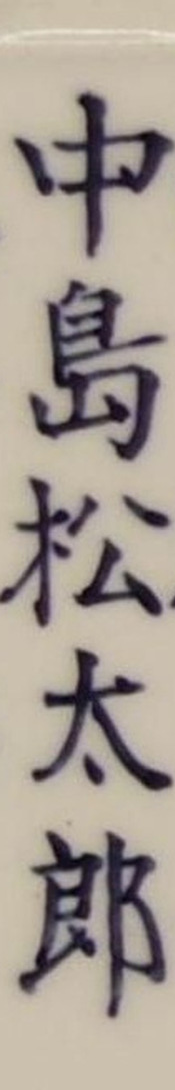中島松太郎
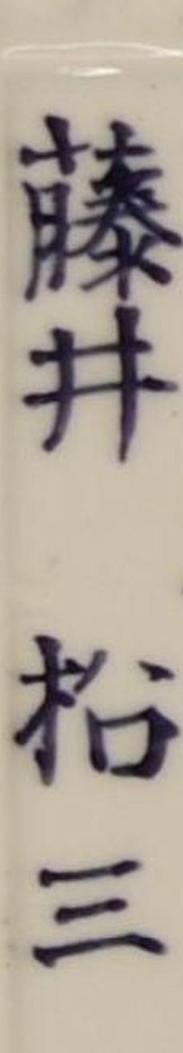藤井松三

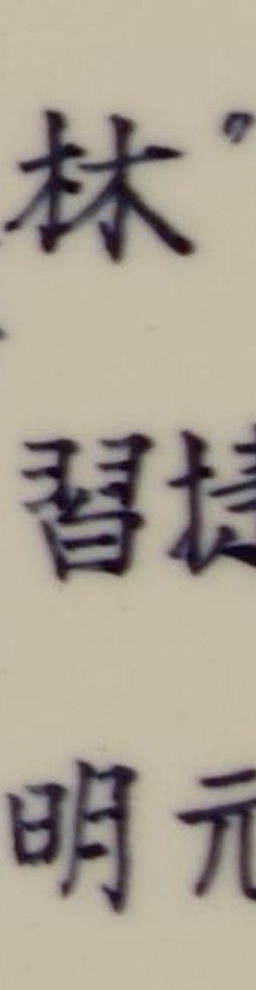林習明
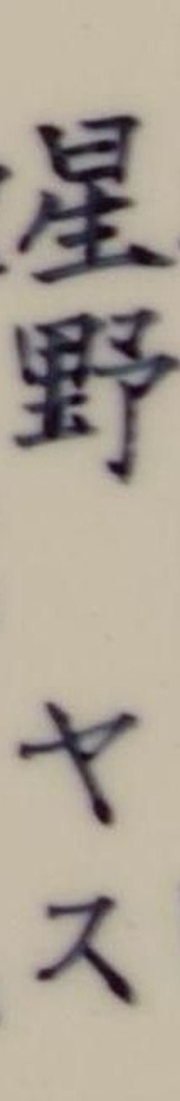星野ヤス
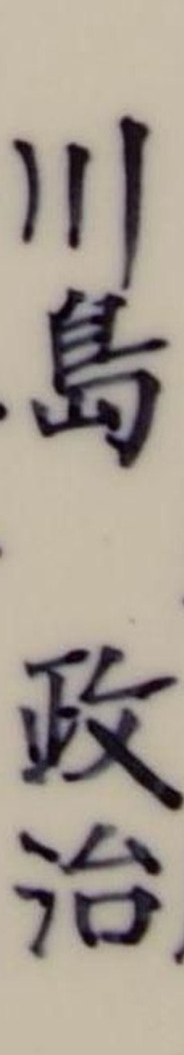川島政治
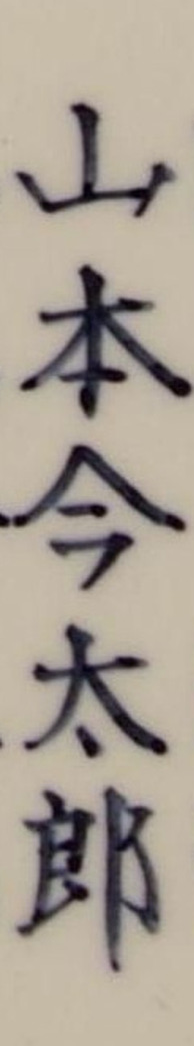山本今太郎
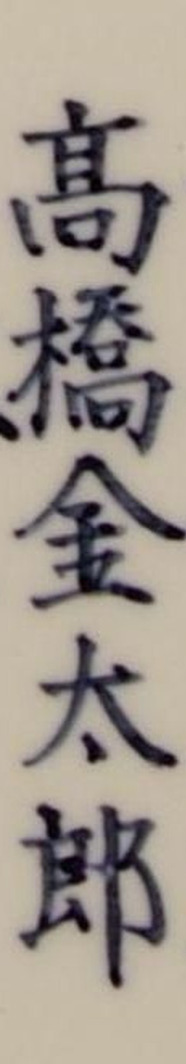高橋金太郎
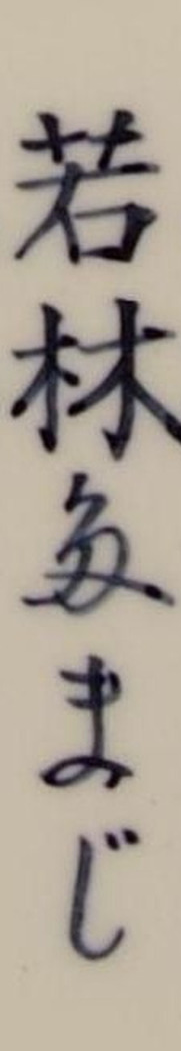若林たまじ
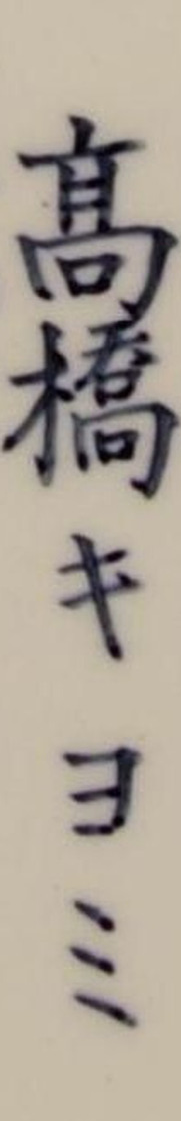高橋キヨミ
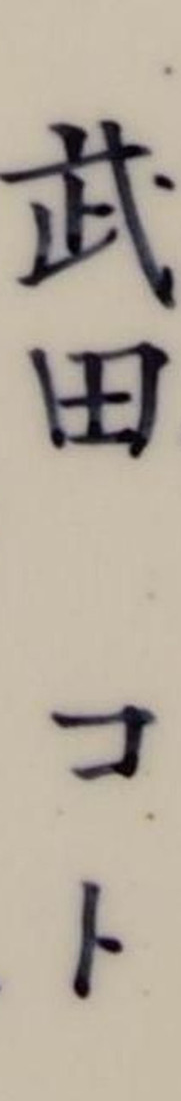武田コト
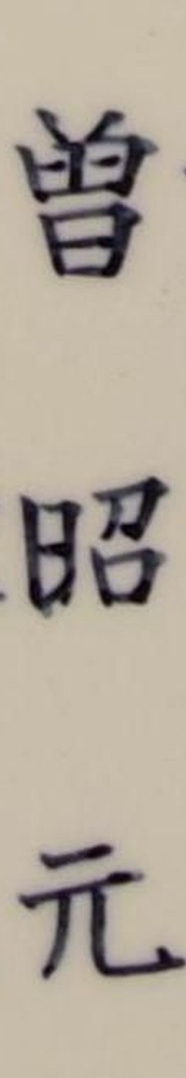曽昭元
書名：M~S
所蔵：高野山金剛峯寺
